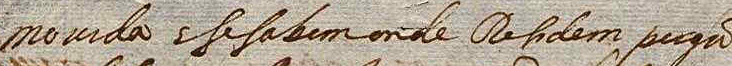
mouida E se sabem onde Residem pergū
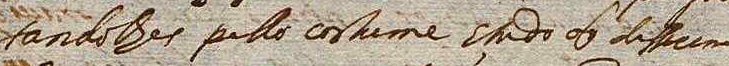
tandolhes pello costume E tudo o q̄ disserem
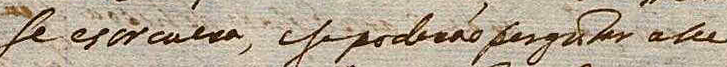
se escreuera, E se poderaõ pergūtar atee
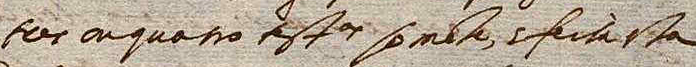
tres ou quatro testas somēte, E feita esta
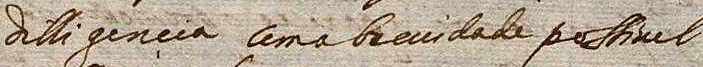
dilligencia com a breuidade possiuel
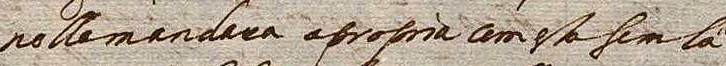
no lla mandara a propria com esta sem la
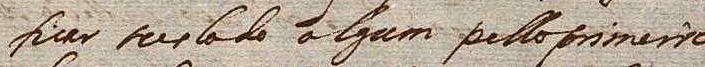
ficar treslado algum pello primeiro
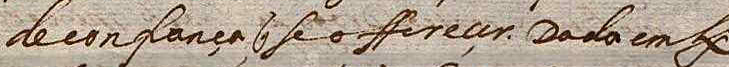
de confiança, q̄ se offerecer. Dada em Lxa
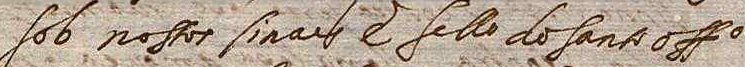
sob nossos sinaes e sello do santo offo
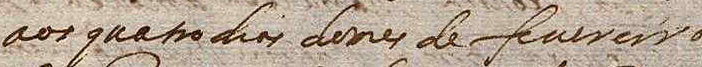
aos quatro dias do mes de feuereiro
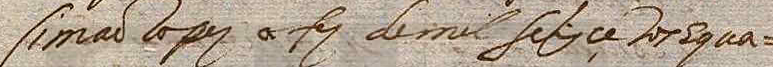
Simaõ lopez a fez de mil seiscētos E qua
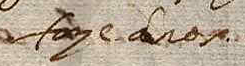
torze an̄os.
